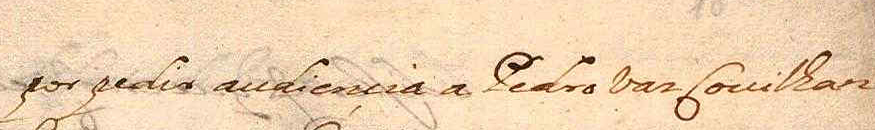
por pedir audiencia a Pedro vaz Couilhan
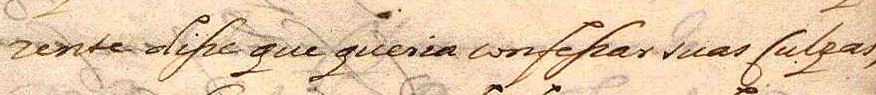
zente disse que queria confessar suas Culpas,
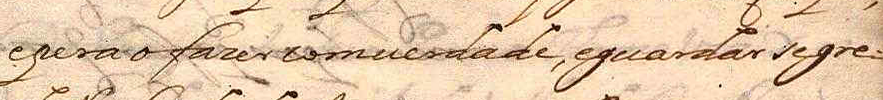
e pera o fazer com uerdade, e guardar segre
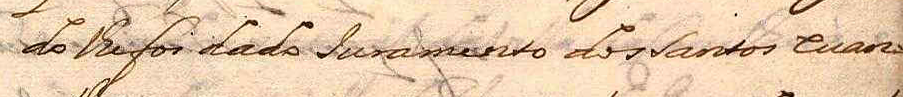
do lhe foi dado Iuramento dos santos Euan
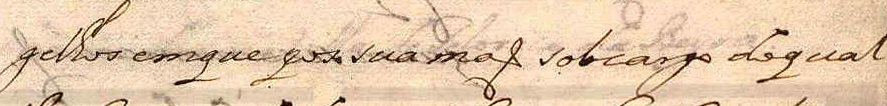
gelhos em que pos sua maõ sob cargo do qual
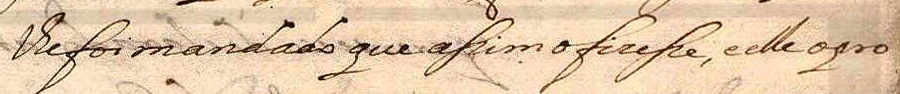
lhe foi mandado que assim o fizesse, e elle o pro
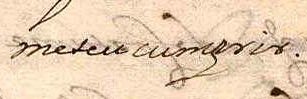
meteu cumprir.
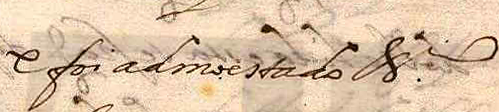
e foi admoestado &.a
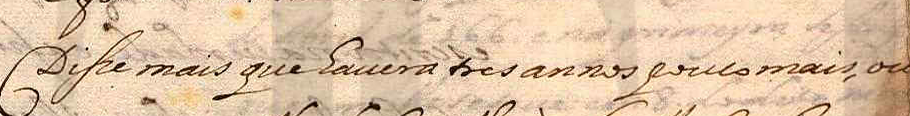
Disse mais que hauera tres annos pouco mais, ou
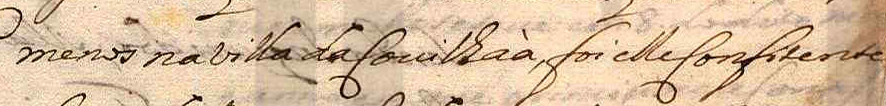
menos na villa da Couilhaã, foi elle Confitente
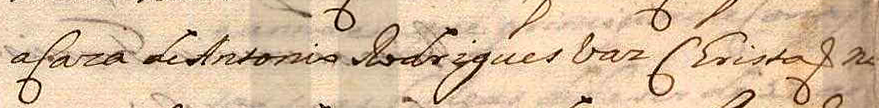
a Caza de Antonio Rodrigues Vaz Christaõ no
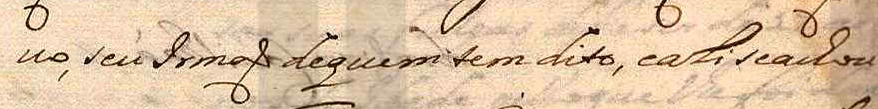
uo, seu Irmaõ de quem tem dito, e aLi se achou
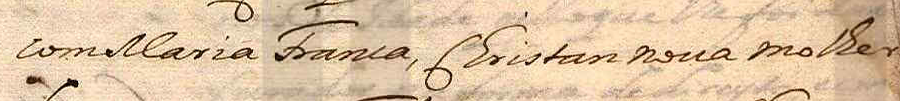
com Maria Franca, Christan noua molher
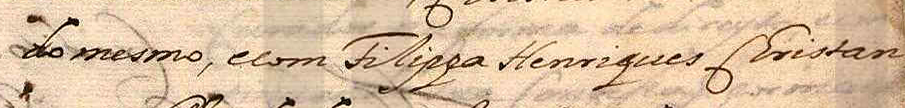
do mesmo, e com Filippa Henriques Christan
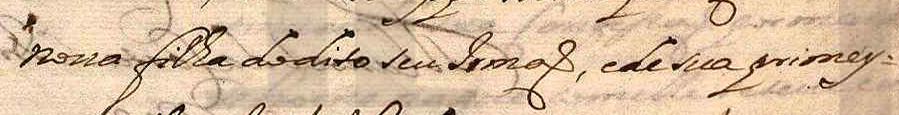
noua filha do dito seu Irmaõ, e de sua primey
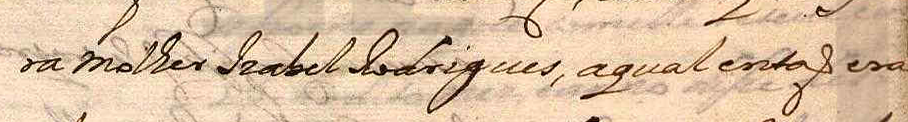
ra molher Izabel Rodrigues, a qual entaõ era
